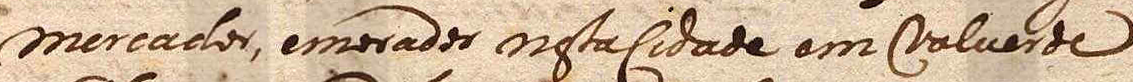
mercador, e morador nesta Cidade em Valuerde
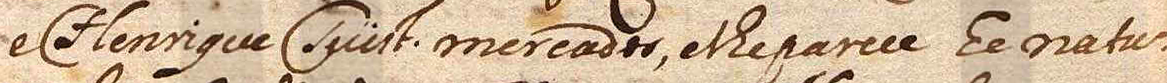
e Henrique Tuist. mercador, e lhe parece he natu
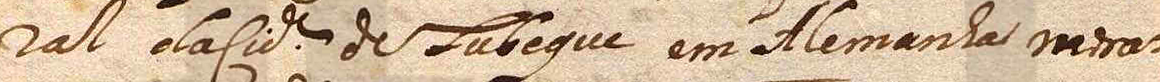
ral da Cid.e de Lubeque em Alemanha mora
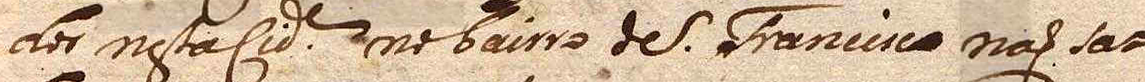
dor nesta Cid.e no bairro de S. Francisco naõ sa
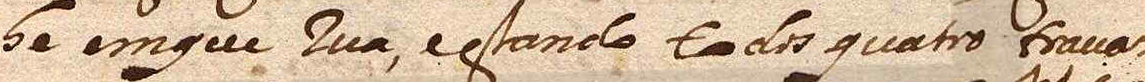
be em que Rua, e estando todos quatro traua
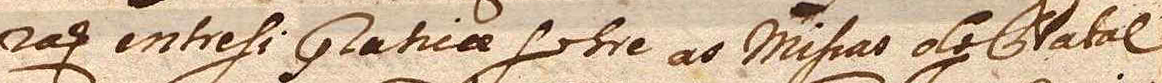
raõ entre si pratica sobre as missas do Natal
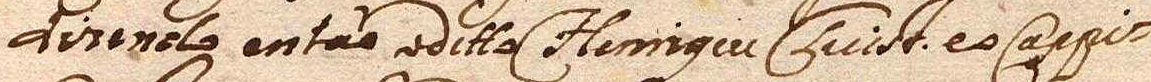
dizendo então o ditto Henrique Tuist. e o Cappi
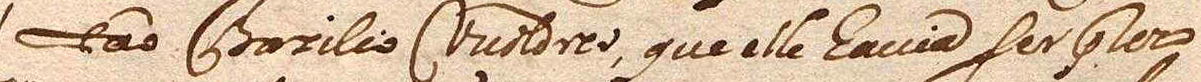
tão Bazilio Vuoldres, que elle hauia ser prezo
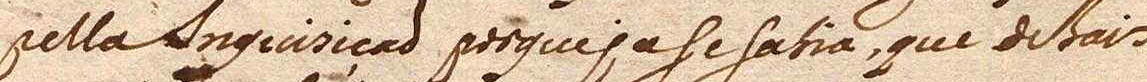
pella Inquisiçaõ porque ja se sabia, que debai
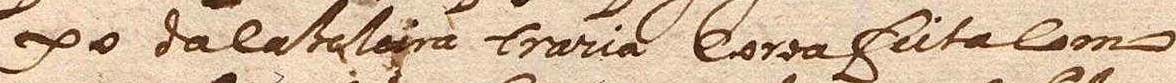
xo da cabeleira trazia coroa feita como
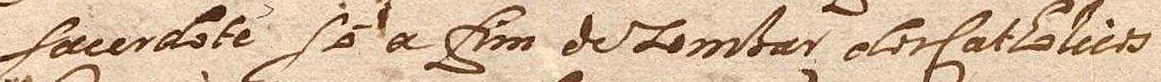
sacerdote só a fim de zombar dos Catholicos
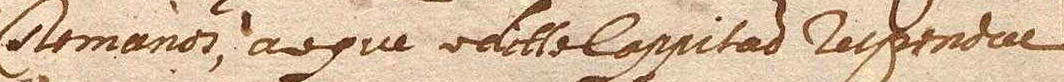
Romanos, ao que o ditto Cappitaõ Respondeu
